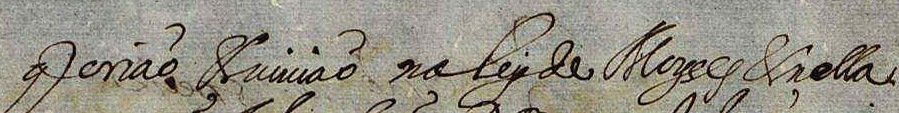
q̄ criaõ & uiuiaõ na Ley de Moyses & nella
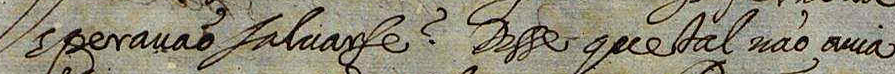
sperauaõ saluarse? Disse que tal naõ auia
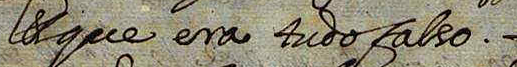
& que era tudo falso.
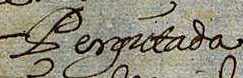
Pergūtada
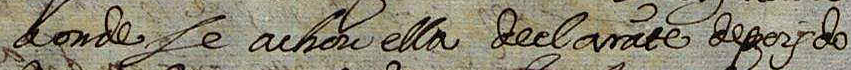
aonde se achou ella declarāte depois do
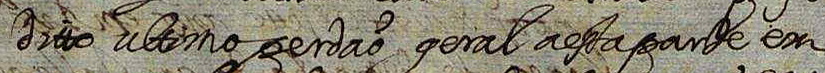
ditto ultimo perdaõ geral a esta parte em
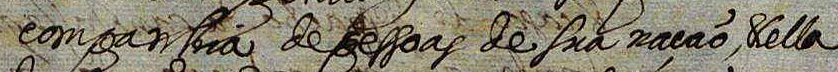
companhia de pessoas de sua naçaõ, & ella
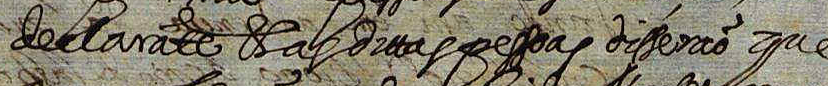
declarāte & as dittas pessoas disseraõ que
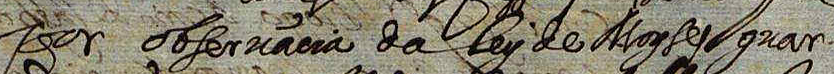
por obseruācia da ley de Moyses guar
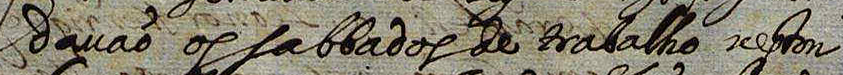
dauaõ os sabbados de trabalho uestin
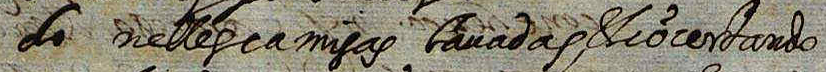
do nelles camisas lauadas, & cōcertando
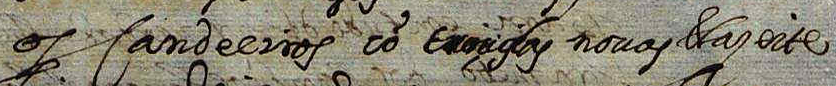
os Candeeiros cō trocidas nouas & azeite
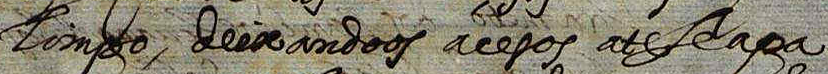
limpo, deixandoos acesos ate se apa
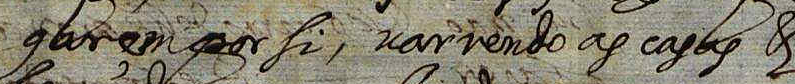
garem por si, uarrendo as casas &
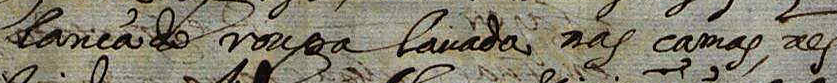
lançādo roupa lauada nas camas, ues
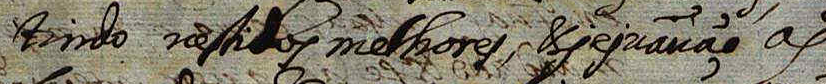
tindo uestidos melhores, & jejuauaõ as
